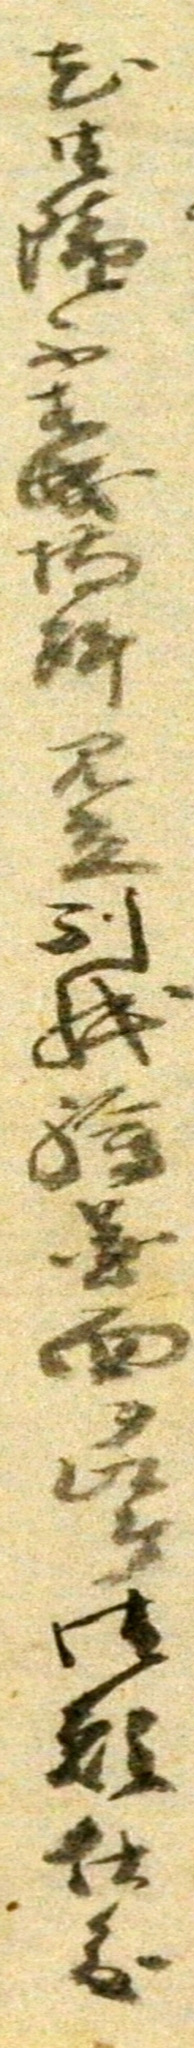尤隔不相成場所見立別紙絵図面ヲ以テ御願仕度
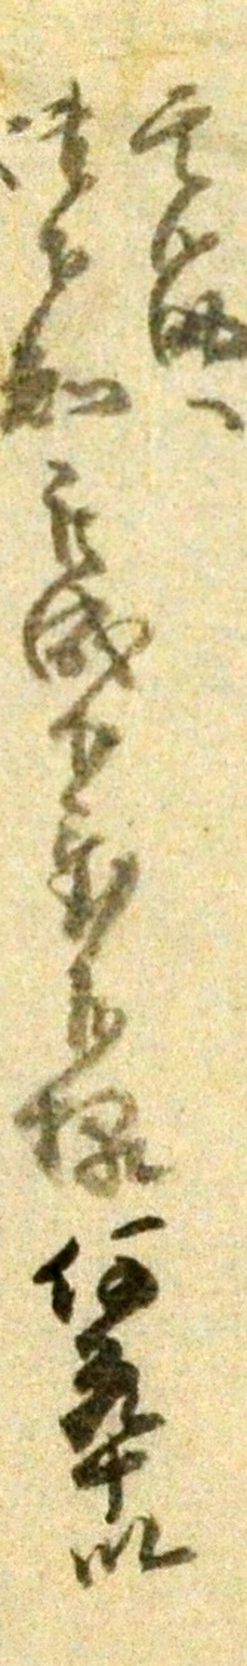御下知被成下置候様何卒以
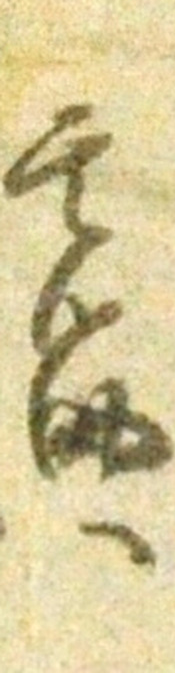其筋へ
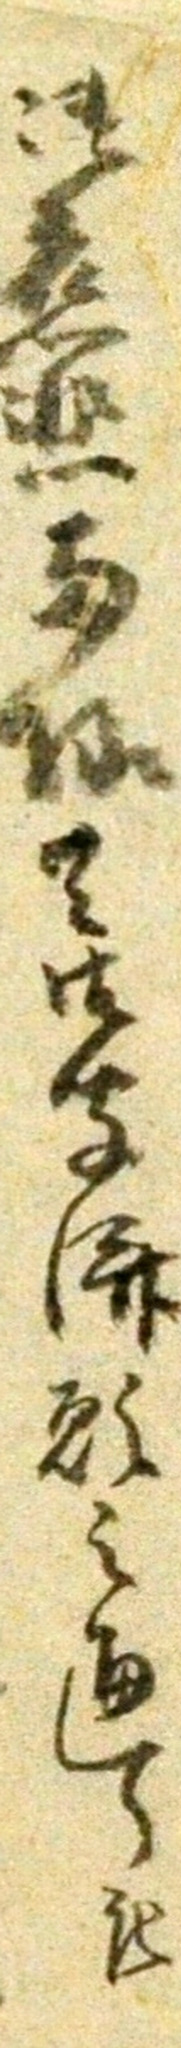御慈悲両様共御聞済願之通り被
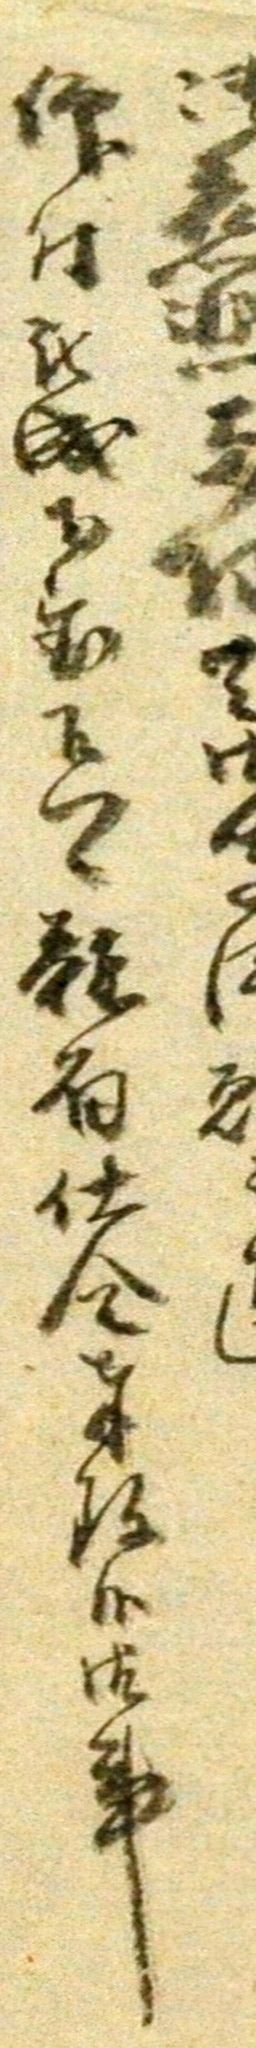仰付被成下置候ハハ難有仕合奉存候御事
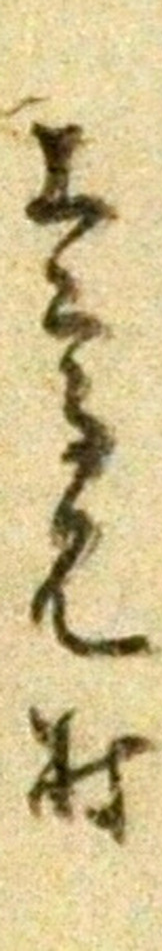上高見村
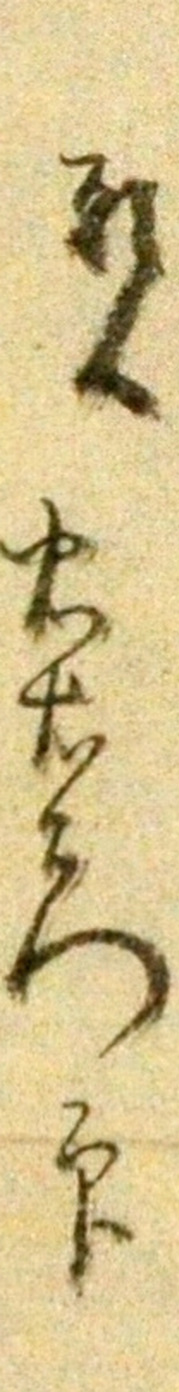忠右衛門印
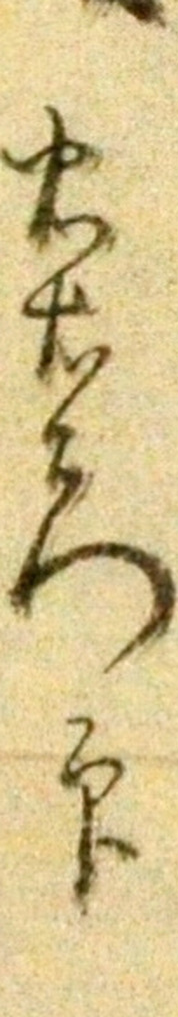忠右衛門印
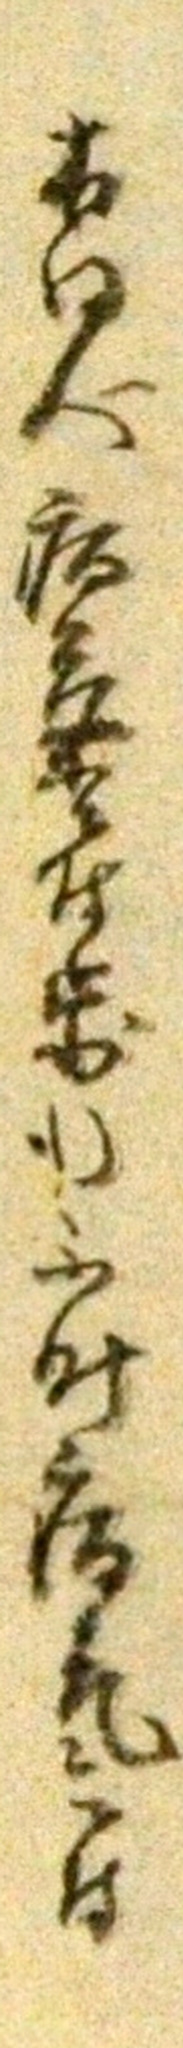四月日右同人病気ニ付歩行不叶病気ニ付

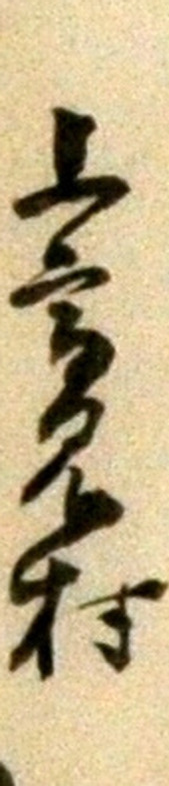上高見村
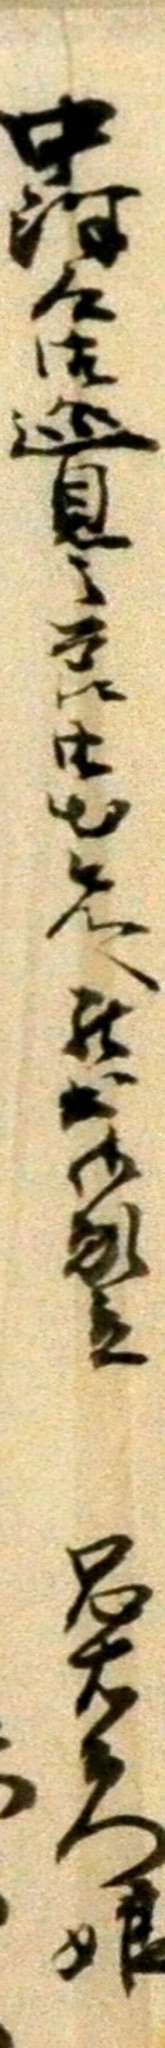中沢郷御巡見之節御出先へ罷出御願立忠右衛門娘
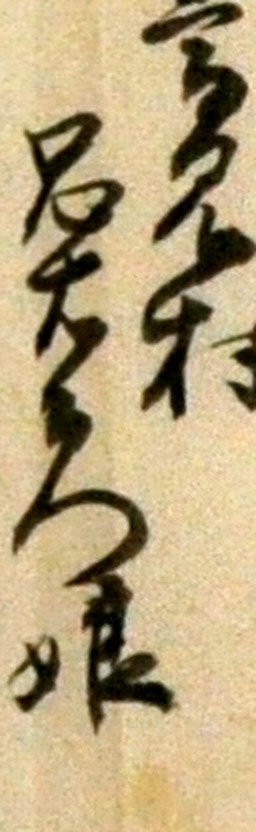忠右衛門兄
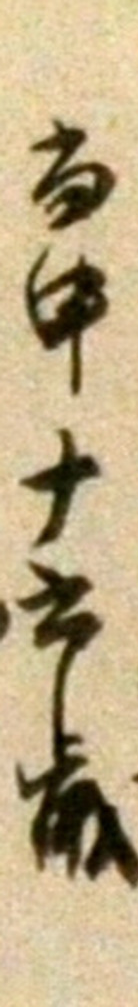当申十六歳
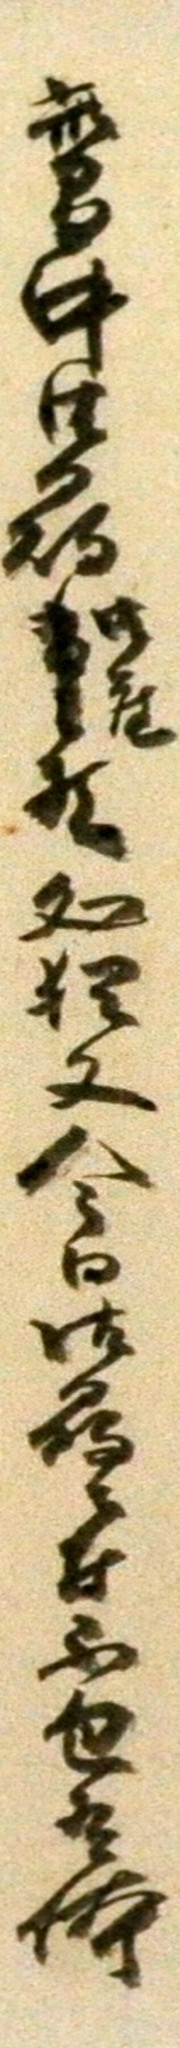此間中御尋御座候処猶又今日御尋ニ付不せ有俸
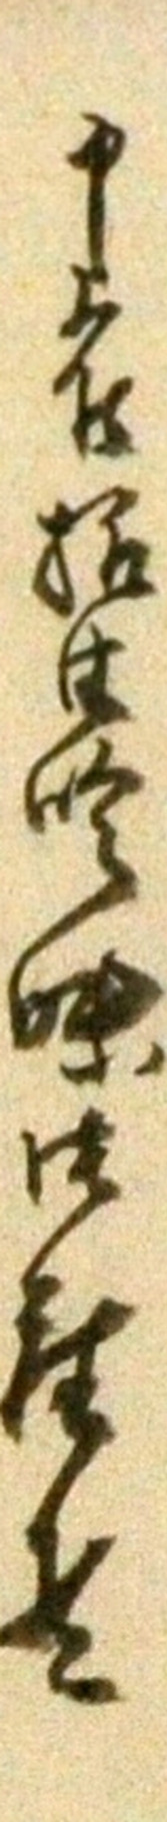申上候様御吟味御座候
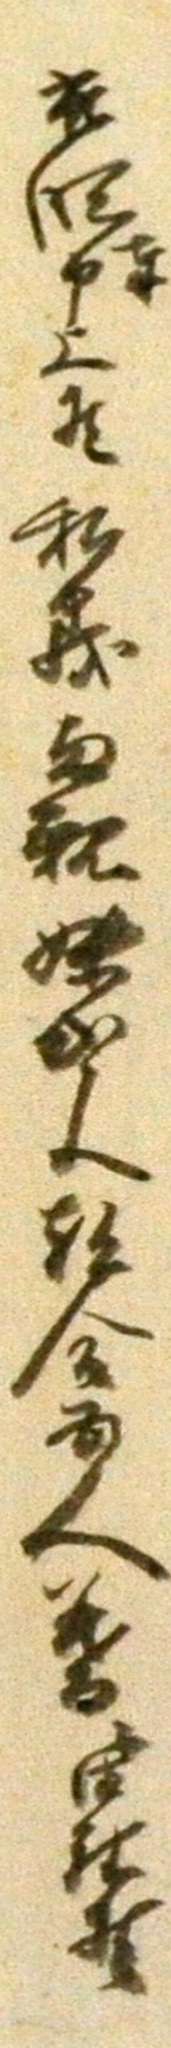此段奉申上候私義両親妹弐人都合五人暮し御座候
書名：中沢村駕籠訴事件書類写
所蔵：伊那市立高遠町図書館・合同会社AMANE
